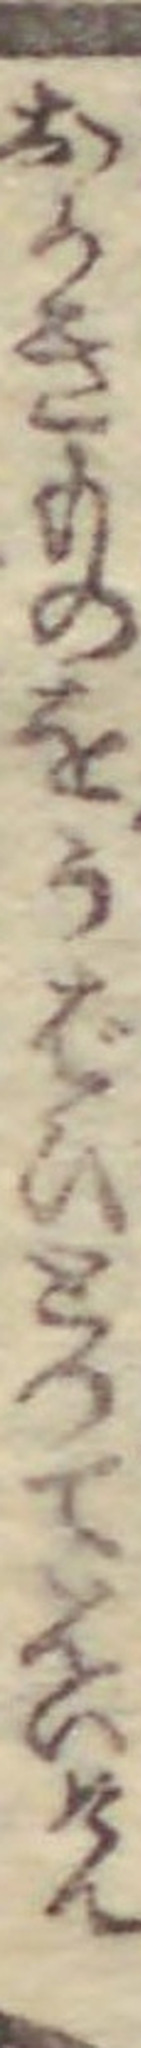おうきものをうばひとつてはいけん
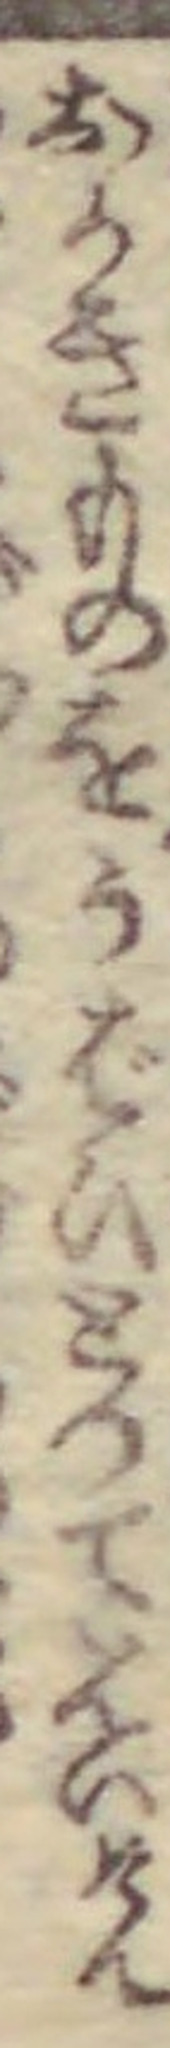おうきものをうばひとつてはいけん
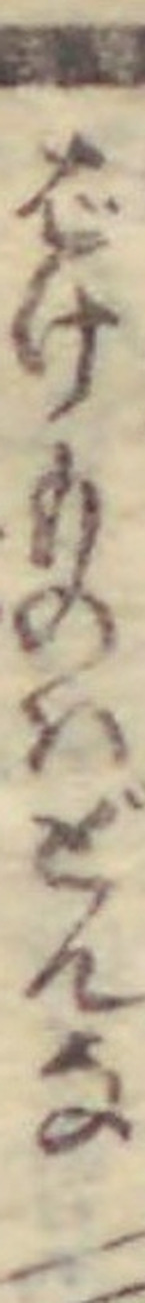ばけものはどんな
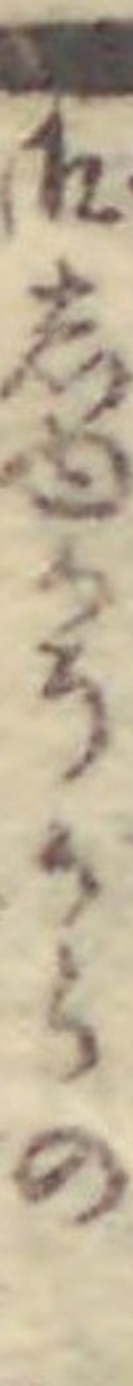御しゆかうからの
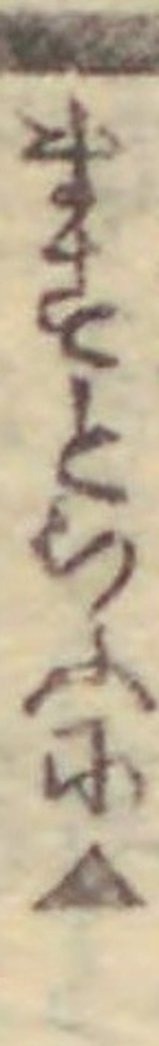ますといふに▲
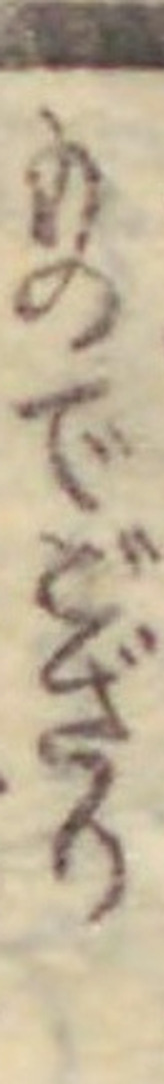ものでござり
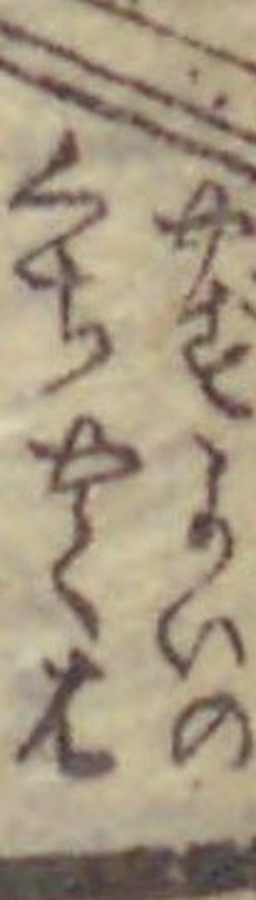くちやくは
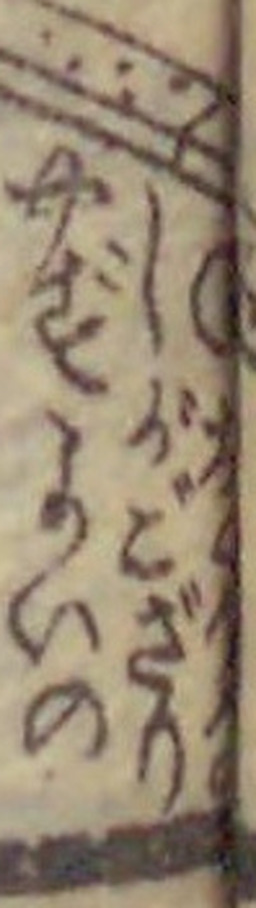やずよいの
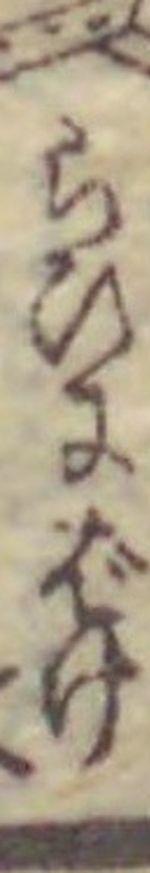らひにばけ
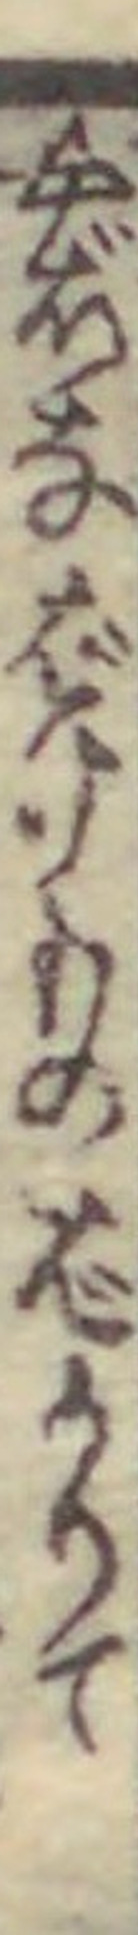やぼなばけものばかりて
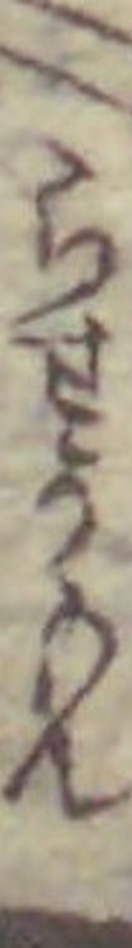らせうもん
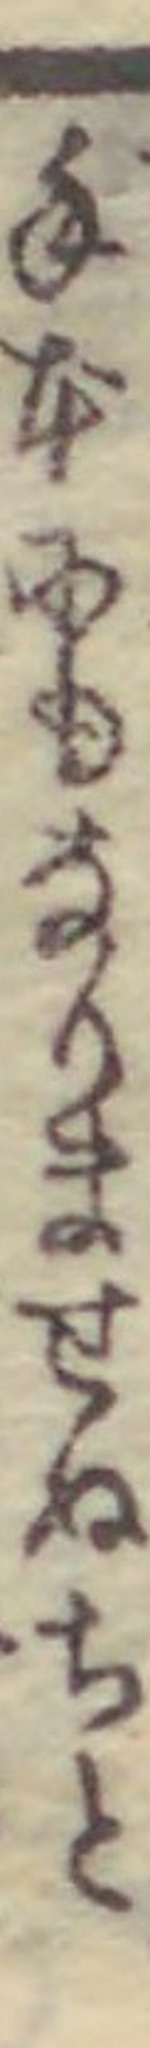手本にもなりませぬちと
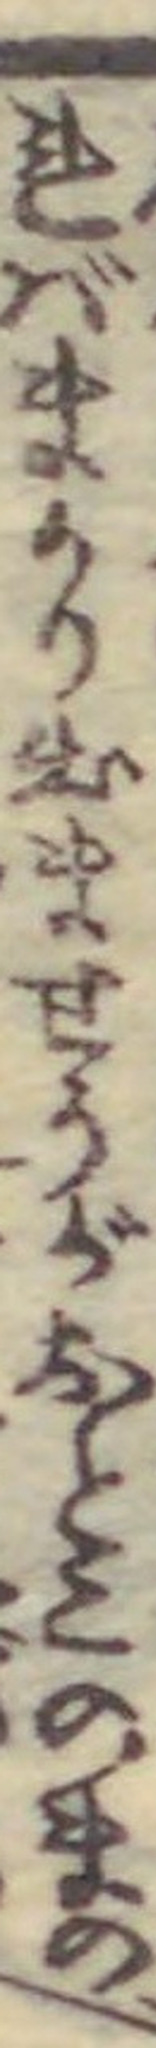ればまかり出ませうがおとこのまの
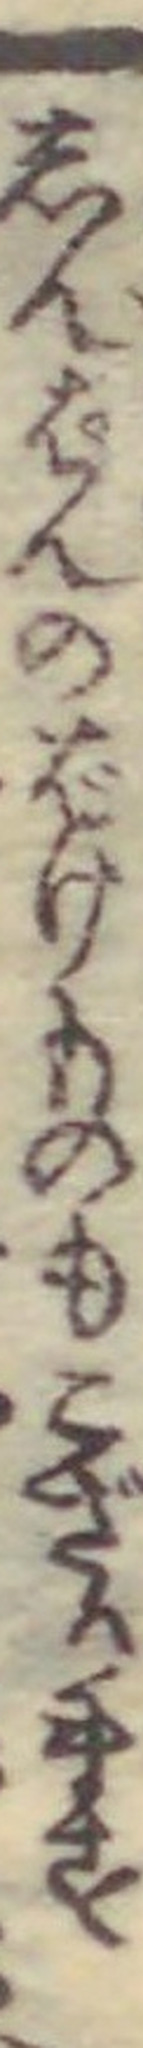しんぱんのばけものもござります
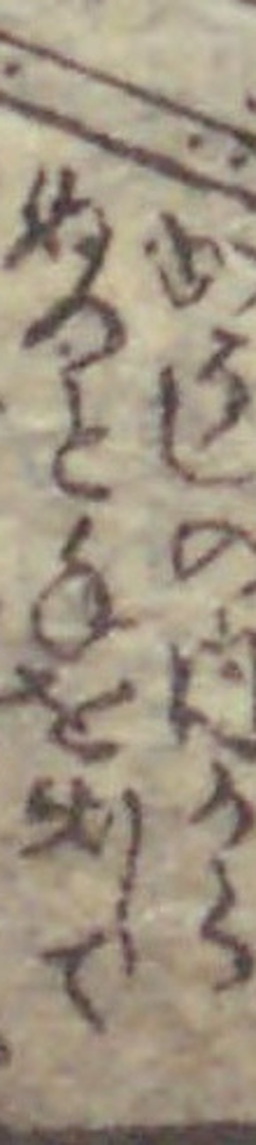ぬつと手を出して
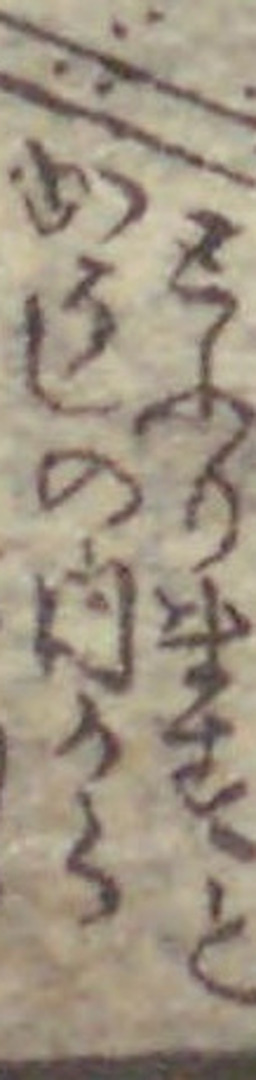かうしの内から
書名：大時代唐土化物 3巻. 曽我太夫染
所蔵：国立国会図書館 National Diet Library, JAPAN
